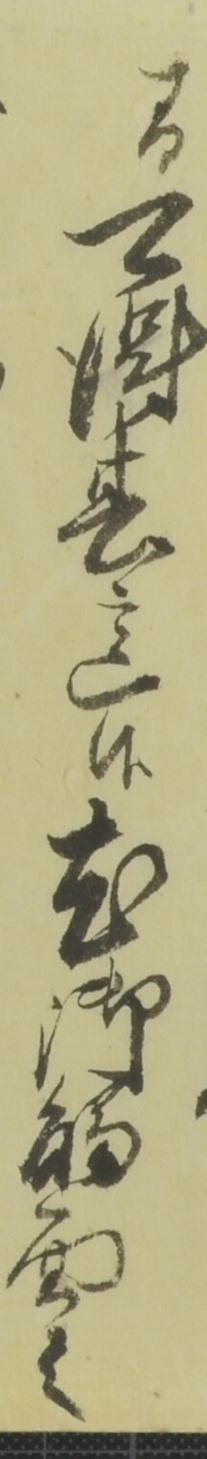間可得其意候尤御触面は
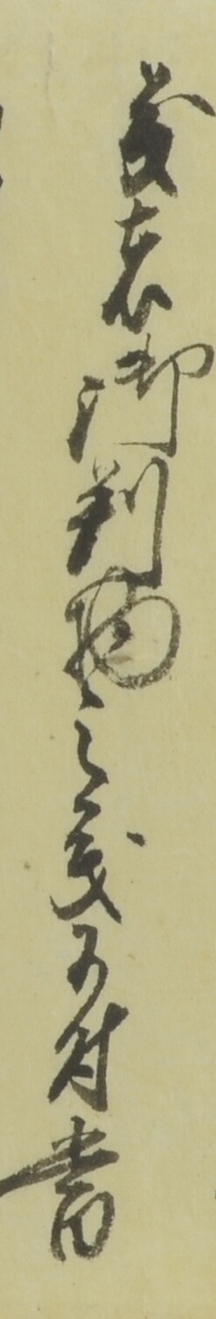義は御判物之義に付当
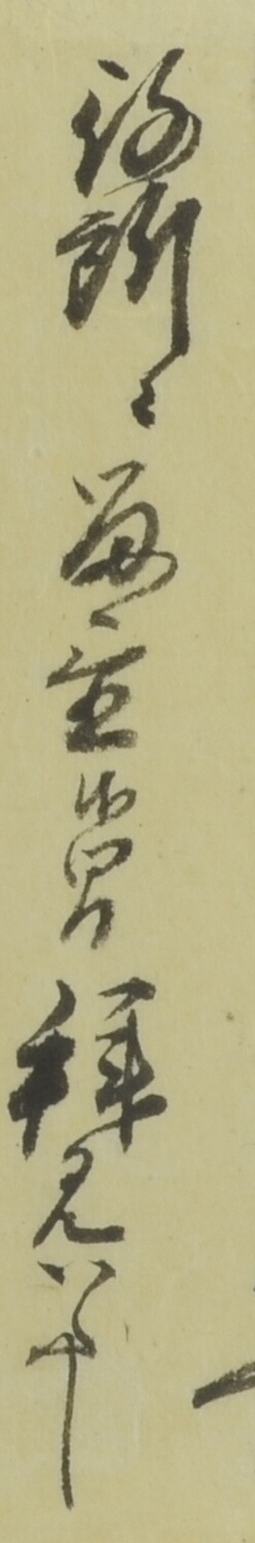役所ニ留置候間拝見いたし
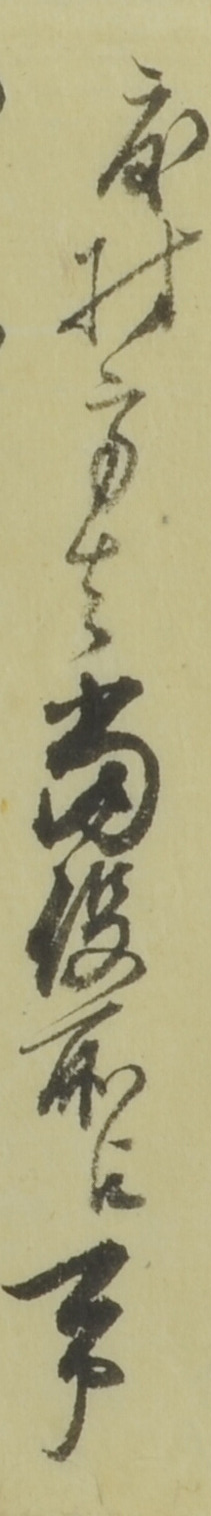度村方は当役所江可申
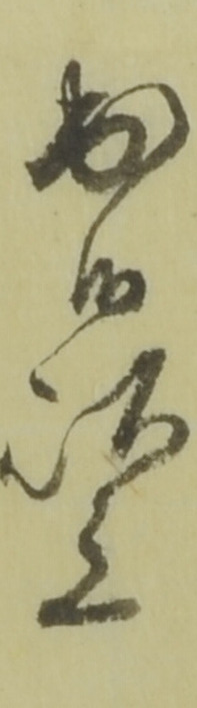出候以上
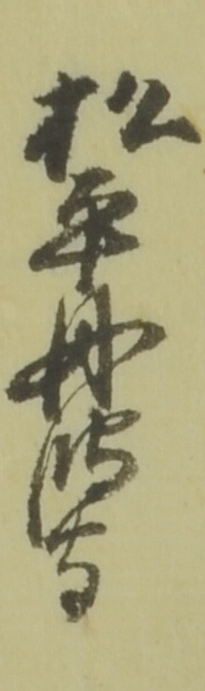松平丹波守
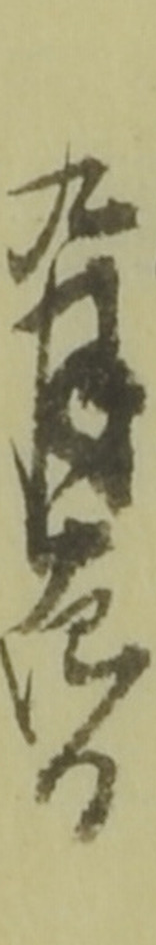九月十四日
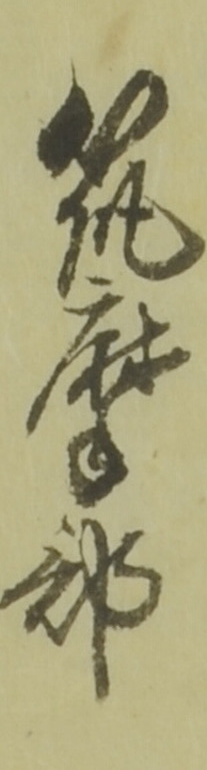筑摩郡
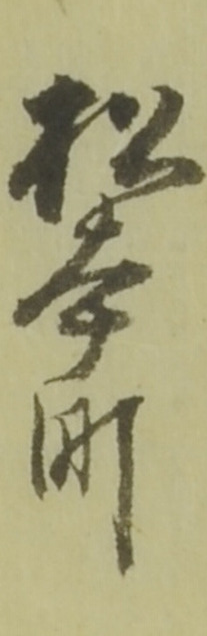松本町
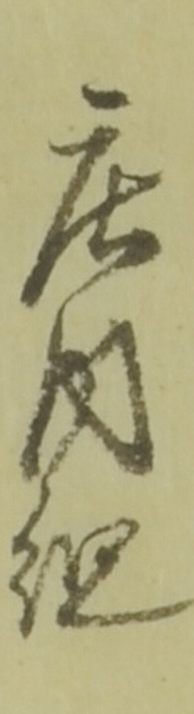庄内組
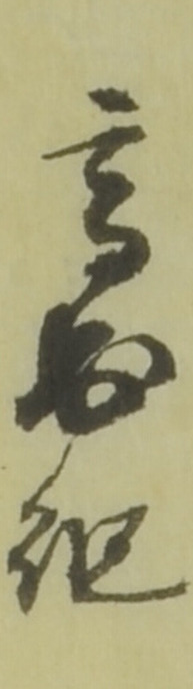高出組
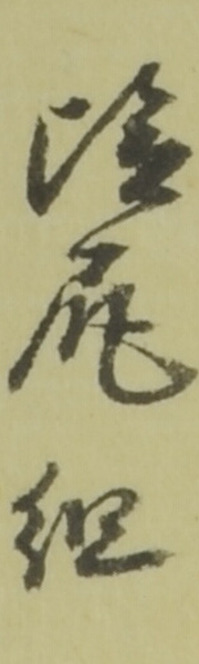塩尻組
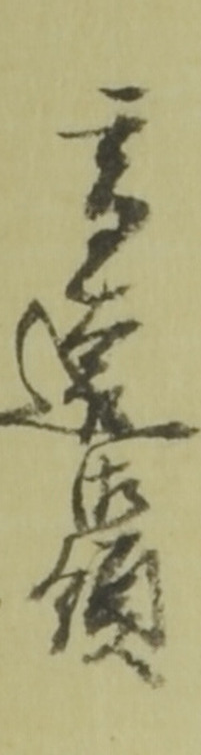高遠御領
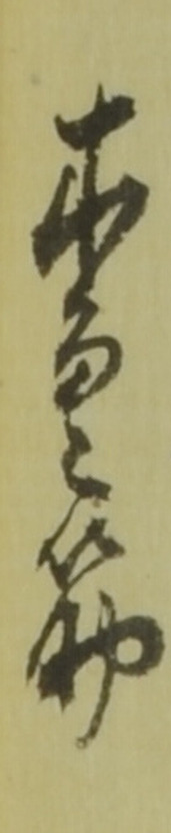木曽筋
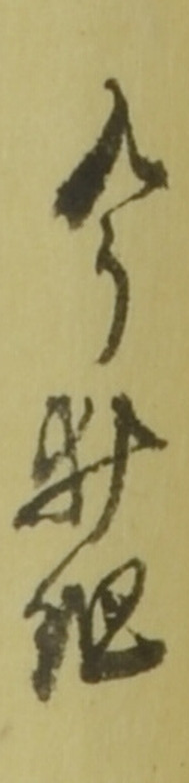今井組
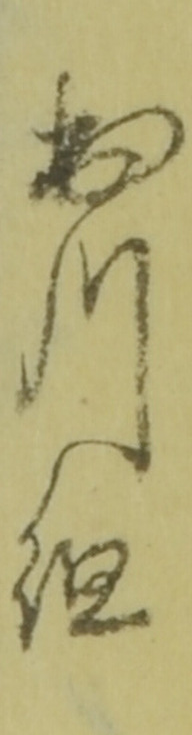出川組
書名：御触書御書附控
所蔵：伊那市立高遠町図書館・合同会社AMANE
